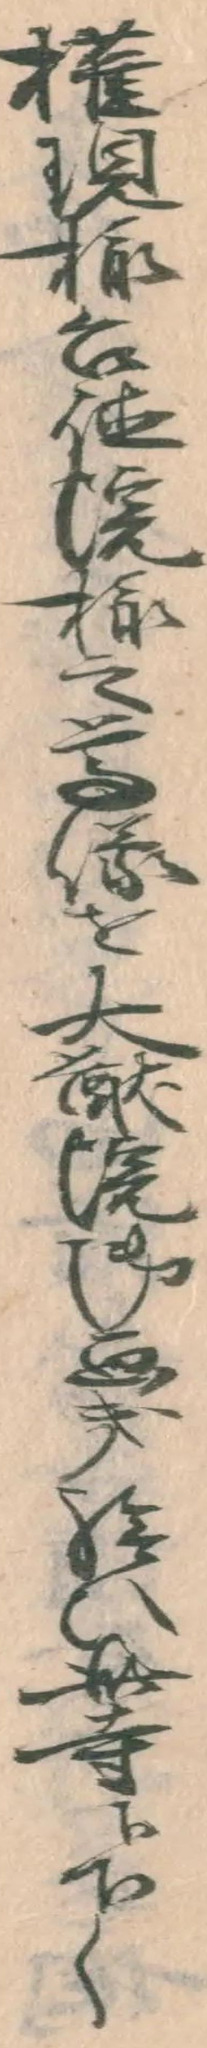権現様台徳院様之尊像を大猷院御画き給ひ此寺え下し
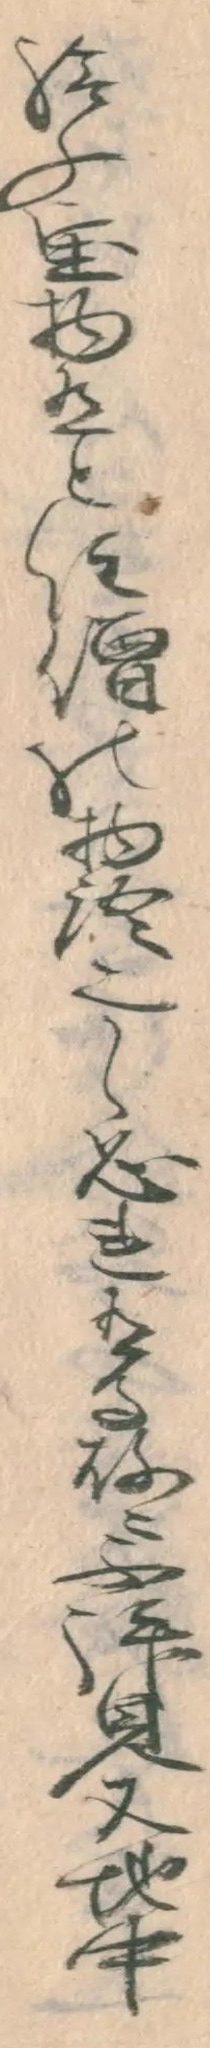給ふ宝物有と住僧の物語也し恐れ有る故に不拝見又地中
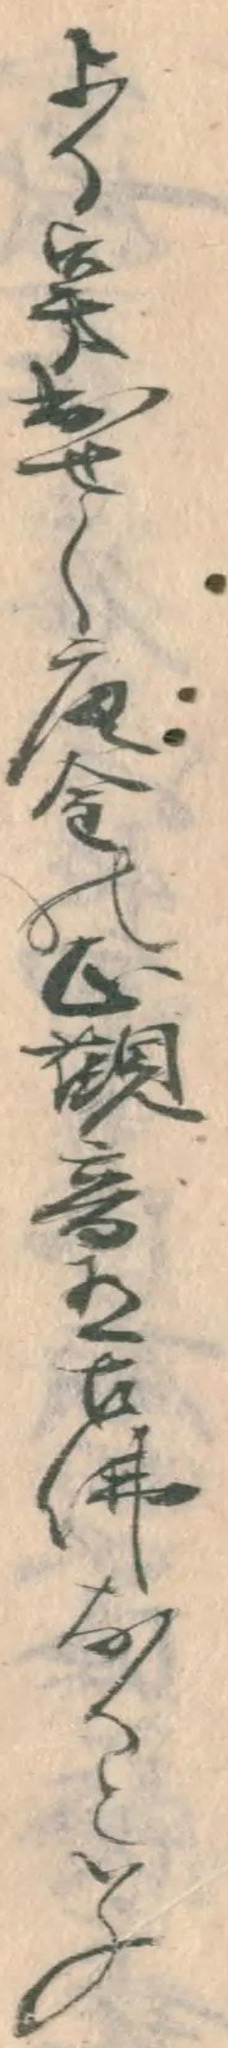より穿出せし唐金の正観音有古仏なりといふ
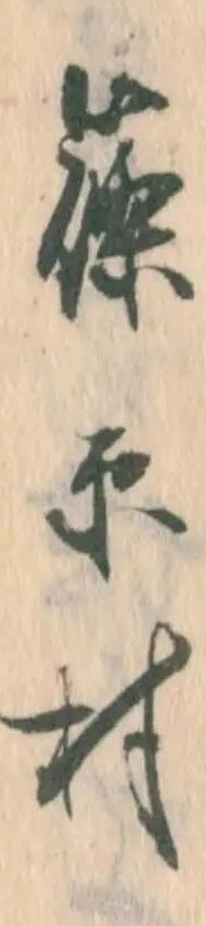篠原村

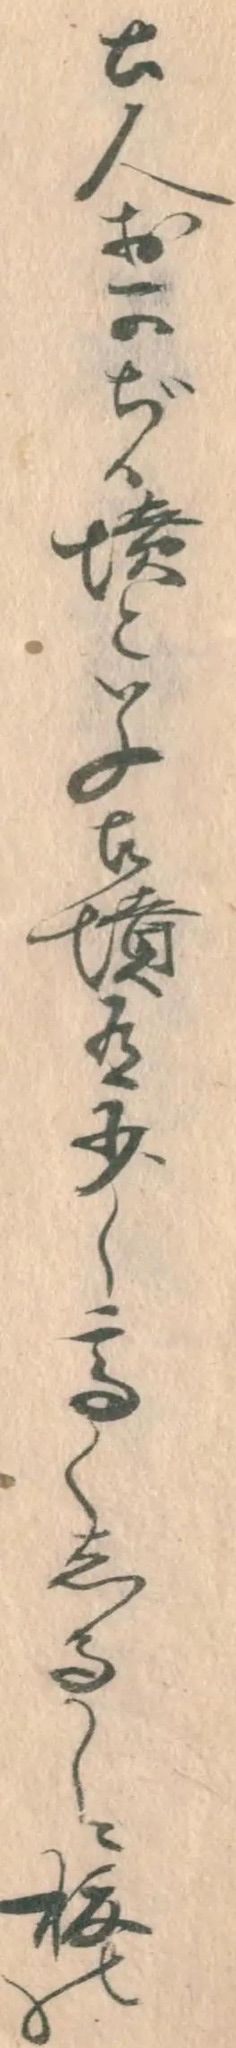土人おかぢか憤といふ古墳有少し高くしるしに梅の
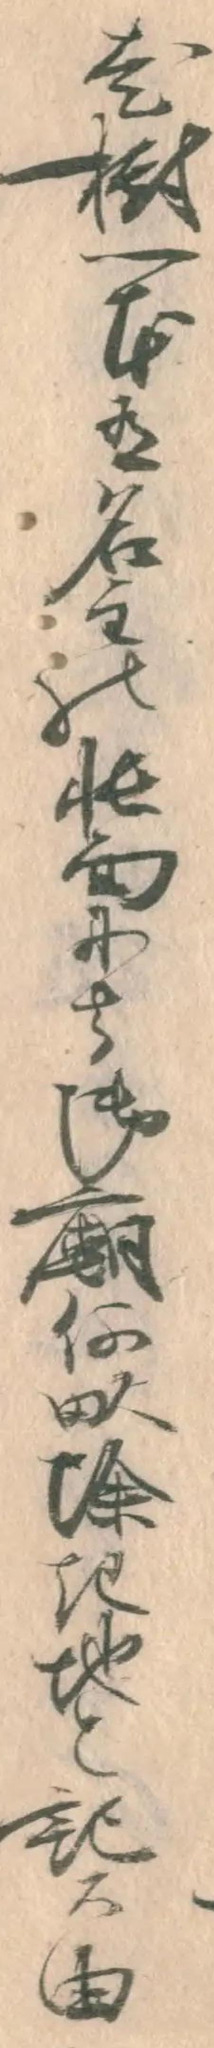老樹一本有名主の帳面には御廟何畝除地を記す由
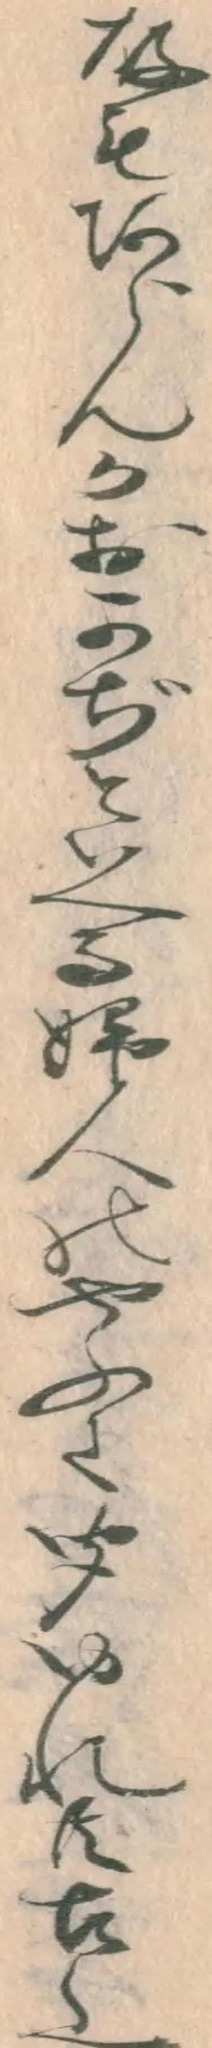故もあらんかおかぢといへる婦人のやふに聞ゆれ共古しへ
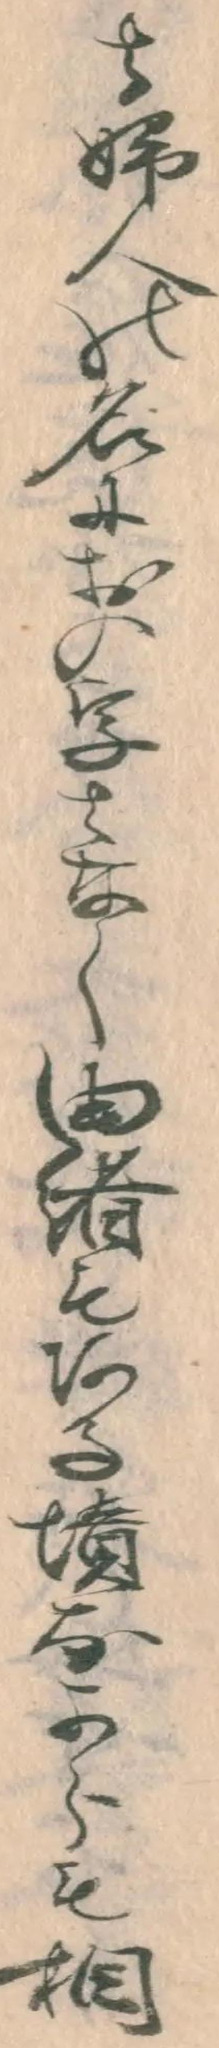は婦人の名におの字はなく由緒もある墳なからも相
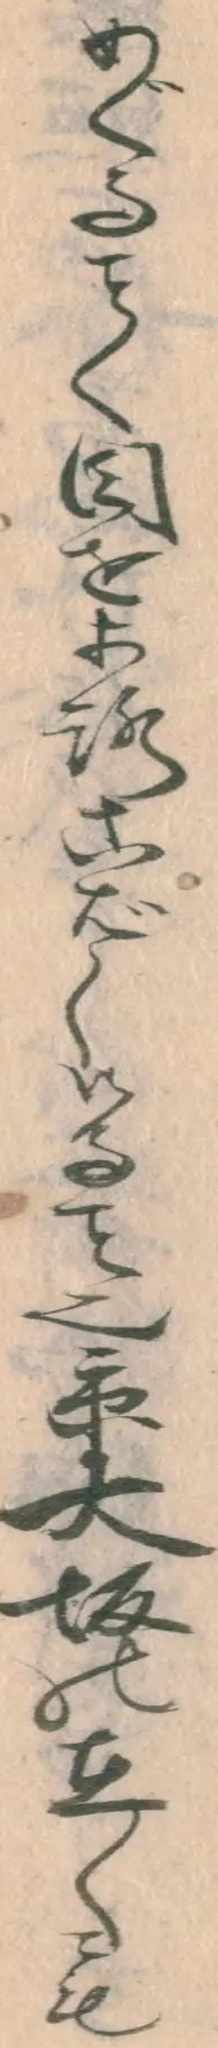めぐることく目をよろこばしけること也京大坂の在〳〵にも
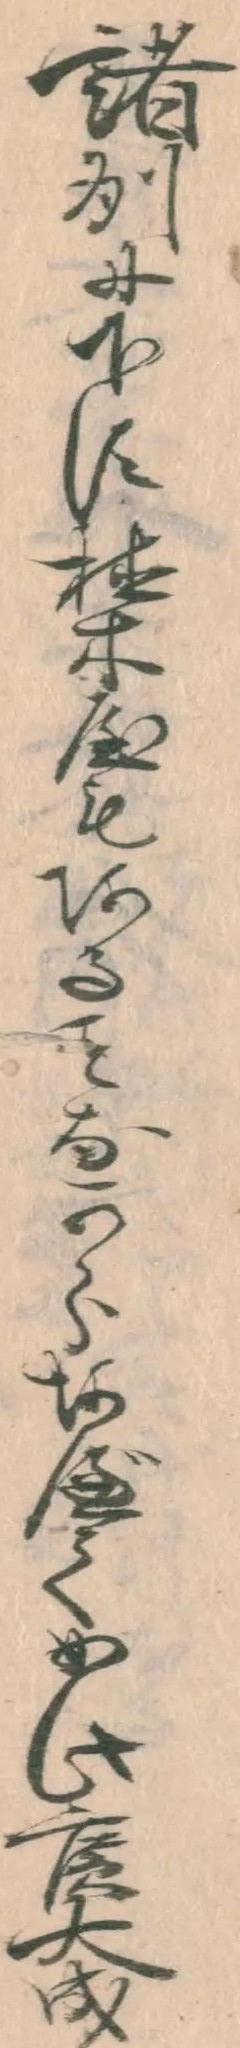諸州に下す植木屋もあることなからなべて如此広大成
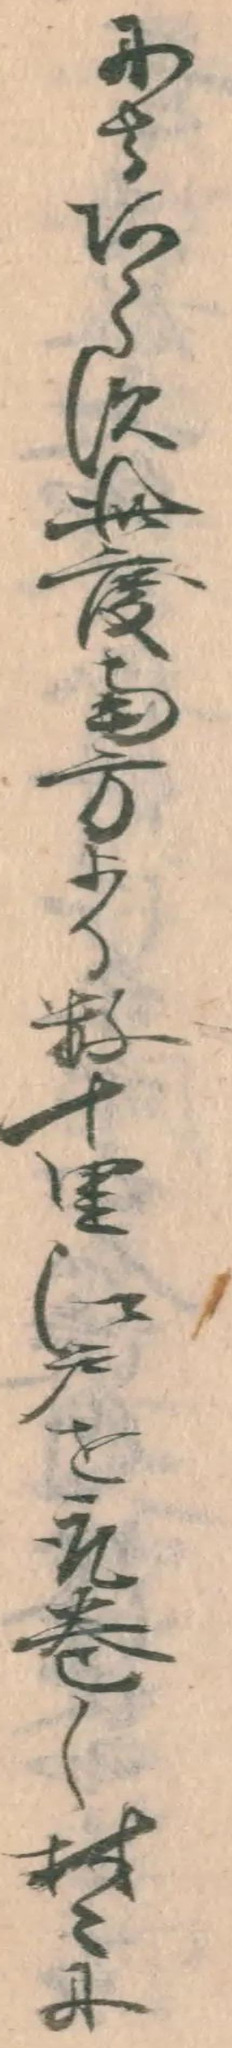にはあらす此度南方より数十里江戸を取巻し村々に
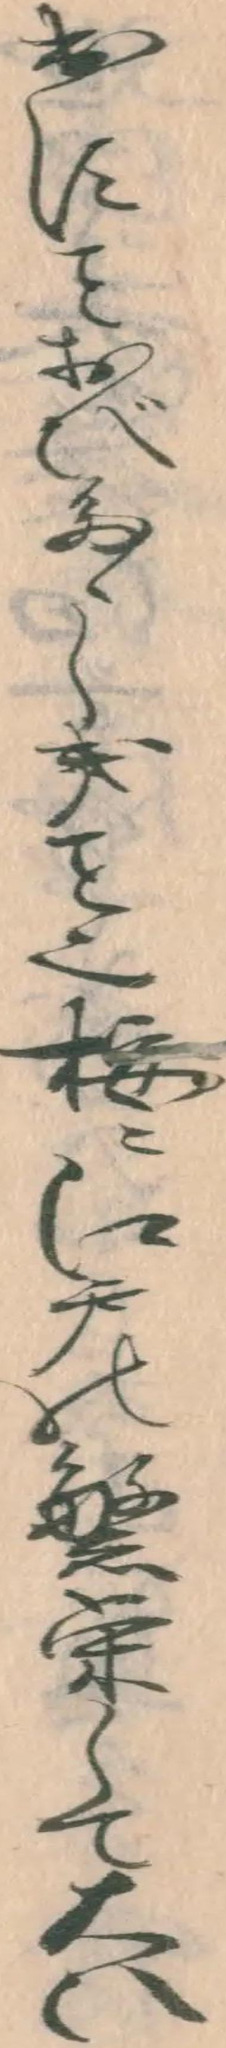出すことおびたゝしきこと也按に江戸の繁栄して大ひ
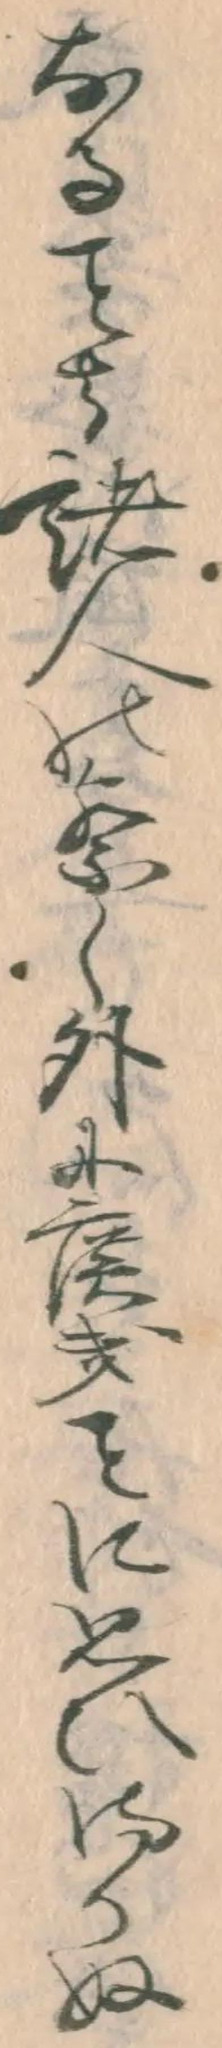なることは諸人の察し外に広きことに思ひ侍りぬ
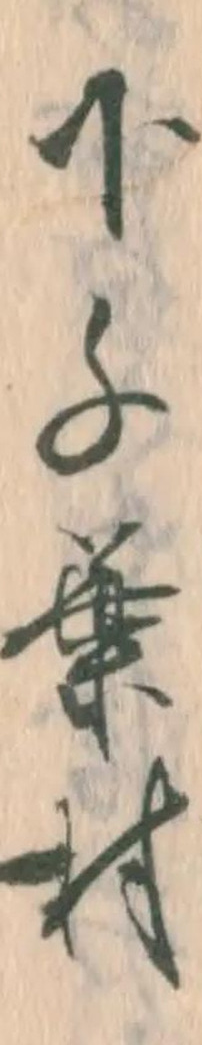下千葉村
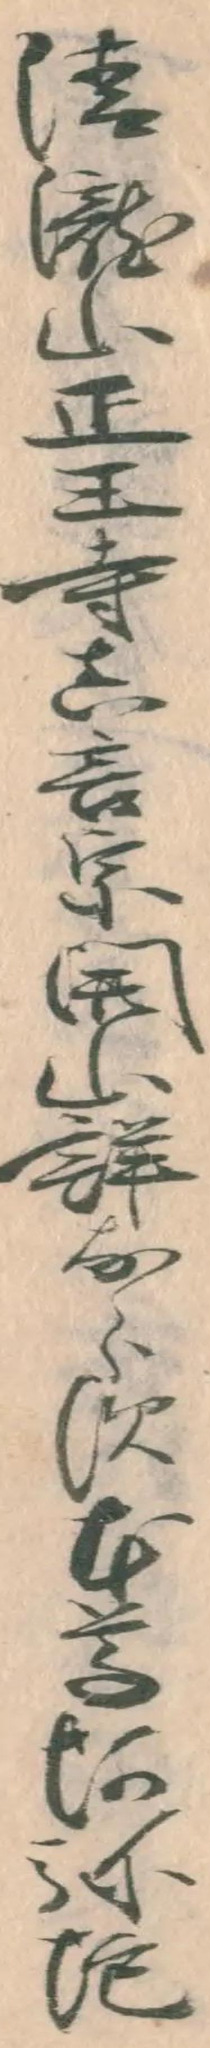清滝山正王寺真言宗開山詳ならす本尊阿弥陀
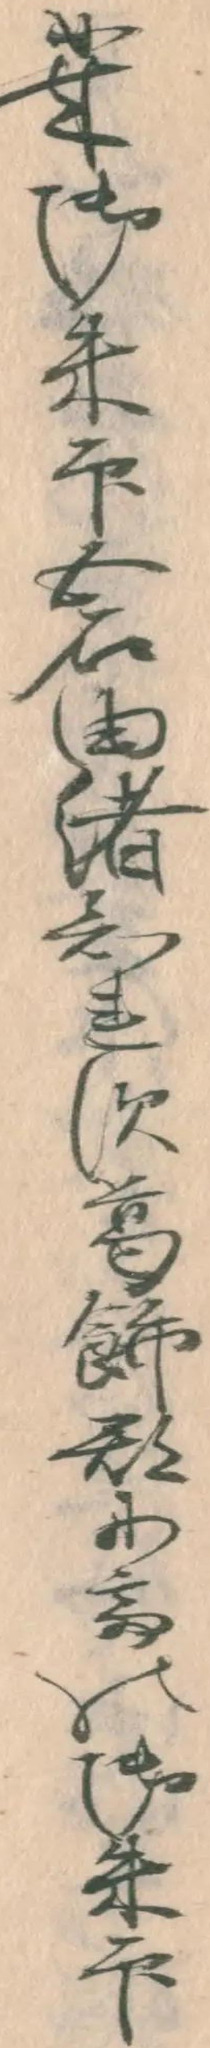如来御朱印五石由緒知れす葛飾郡にての御朱印
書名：四神地名録 6巻. [4]葛飾郡
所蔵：国立国会図書館 National Diet Library, JAPAN
